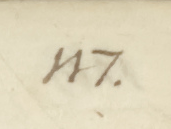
117
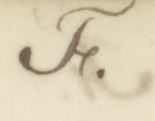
F
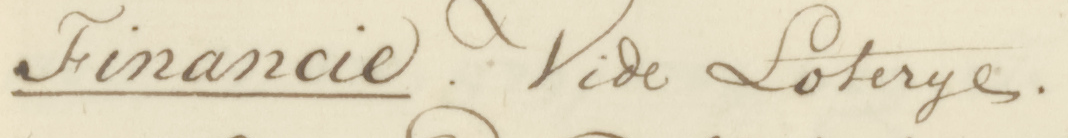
Financie vide Loterije
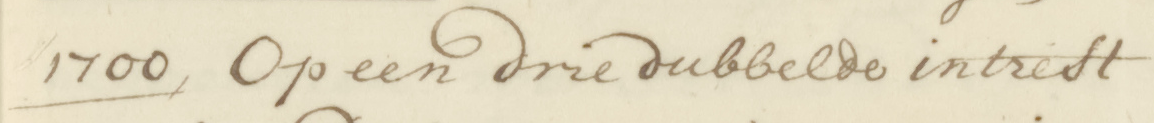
1700. Op een drie dubbelde intrest
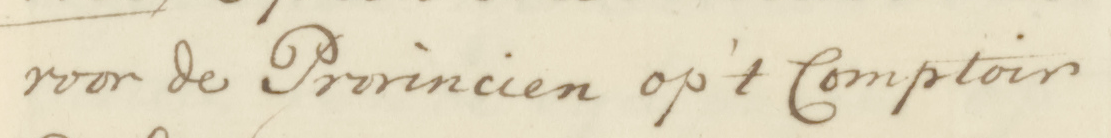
voor de Provincien op 't Comptoir
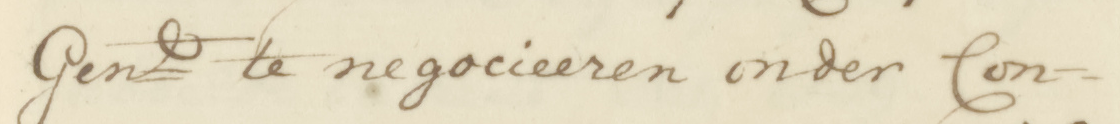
Genl te negocieeren onder con„
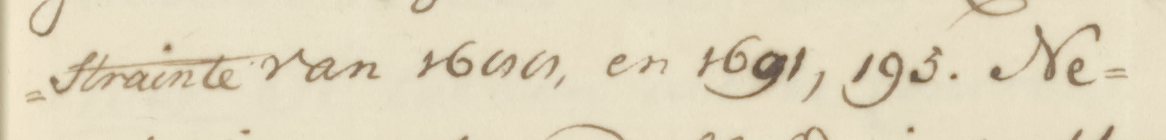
strainte van 1688 en 1691, 195. Ne„
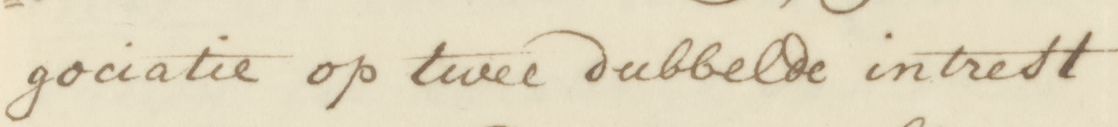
gociatie op twee dubbelde intrest
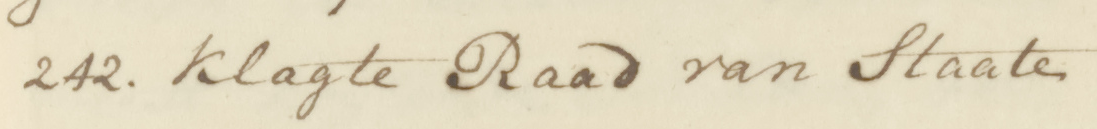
242. Klagte Raad van Staate
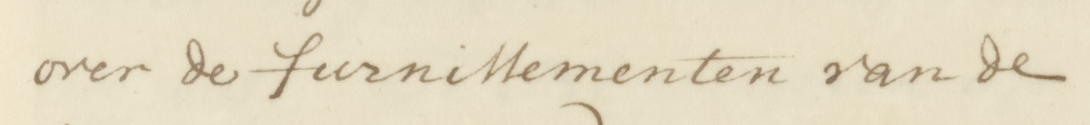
over de furnissementen van de
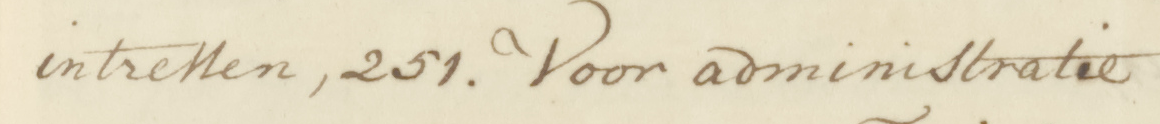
intressen, 251. Voor administratie
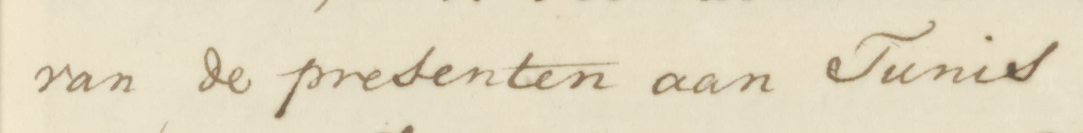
van de presenten aan Tunis
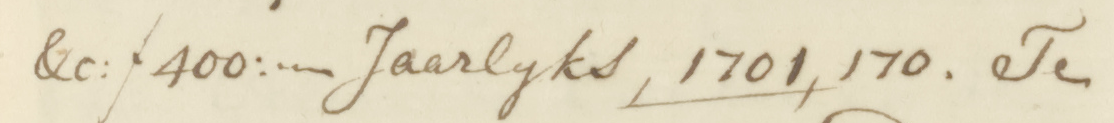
&c. 400: -- jaarlijks 1701, 170. Te
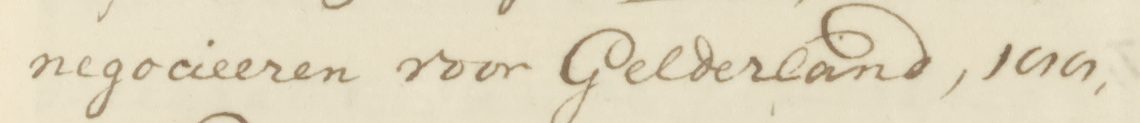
negocieeren voor Gelderland, 188,
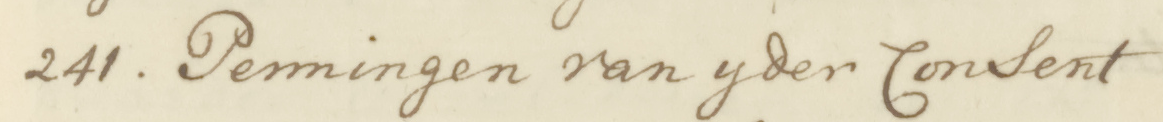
241. Penningen van ijder consent
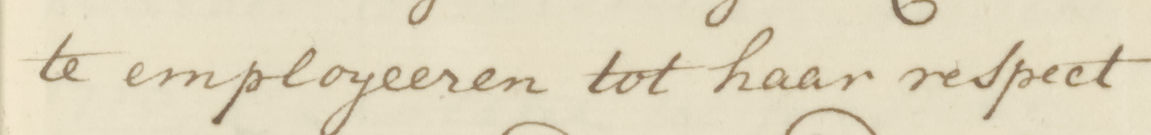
te employeeren tot haar respect
